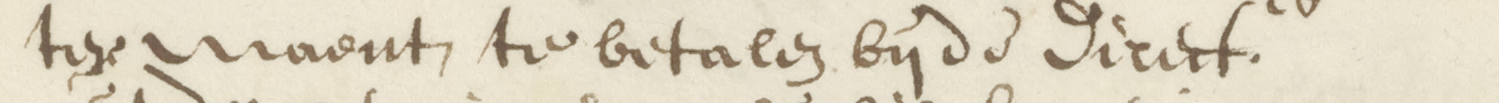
ter maent te betalen bij de directrs.
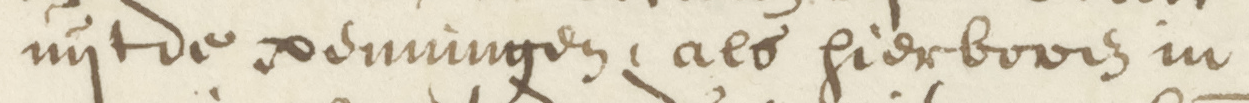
uijt de penningen, als hierboven in
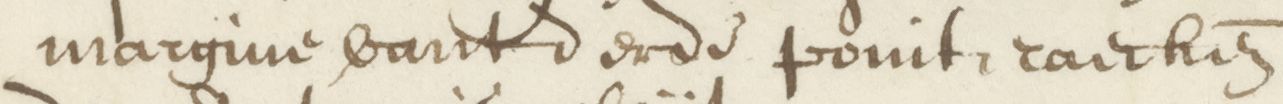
margine vant derde point, raecken
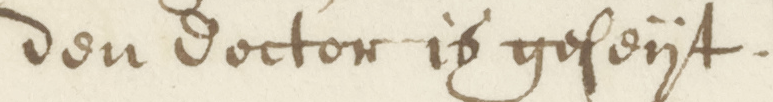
den doctor is geseijt.
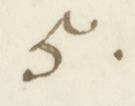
5.
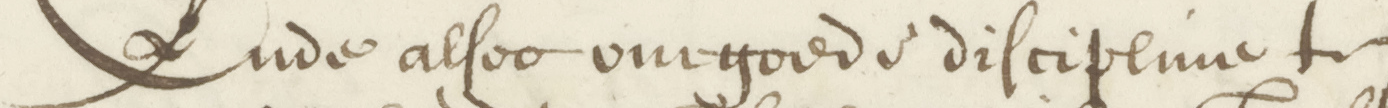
Ende alsoo om goede discipline te
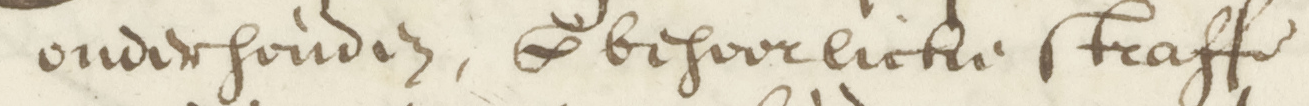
onderhouden, & behoorlicke straffe
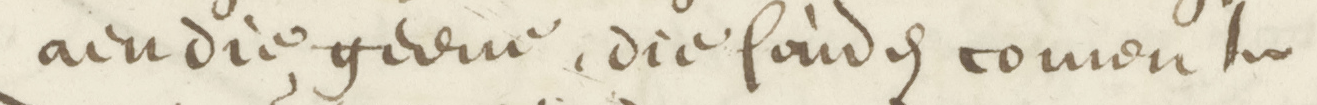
aen die geene, die souden comen te
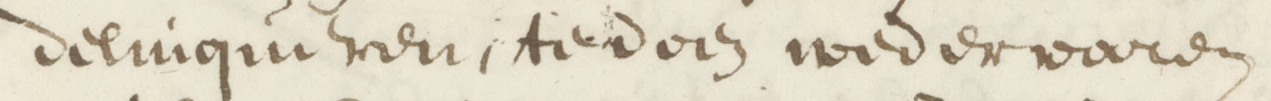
delinqueren, te doen wedervaren
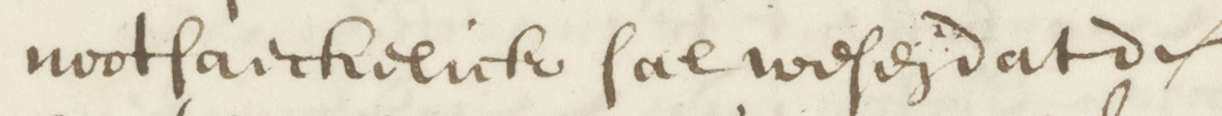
nootsaeckelick sal wesen dat de
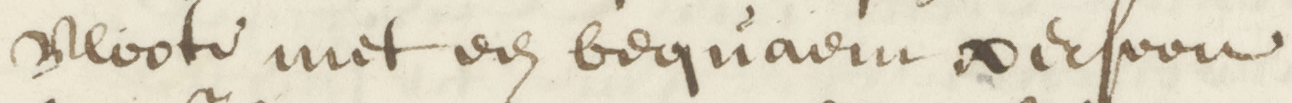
Vloote met een bequaem persoon
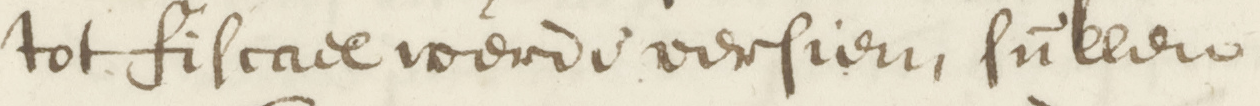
tot fiscael werde versien, sullen
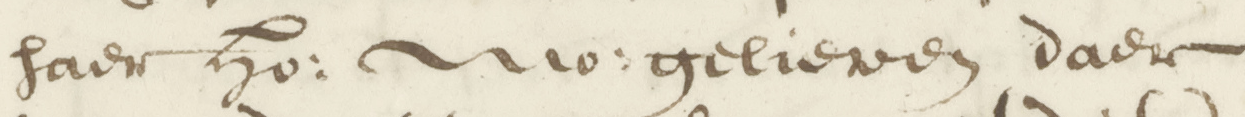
haer Ho:mo: gelieven daer
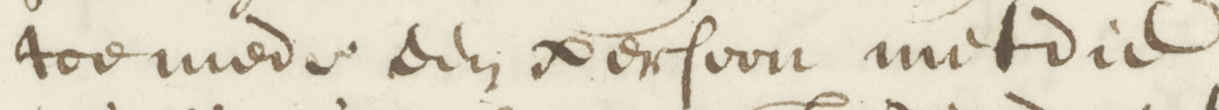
toe mede een persoon met die
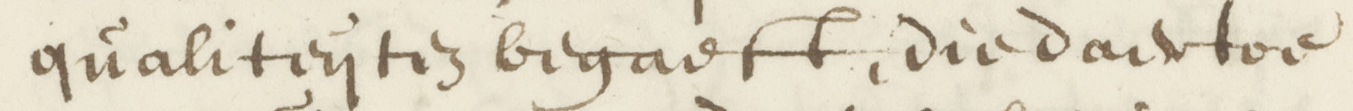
qualiteijten begaeft, die daertoe
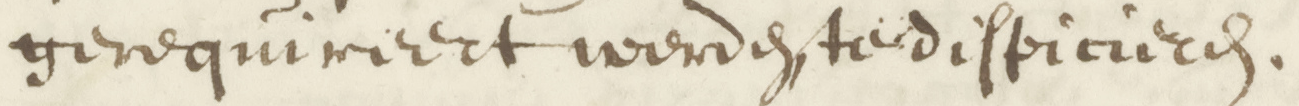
gerequireert werden te dispicieren.
